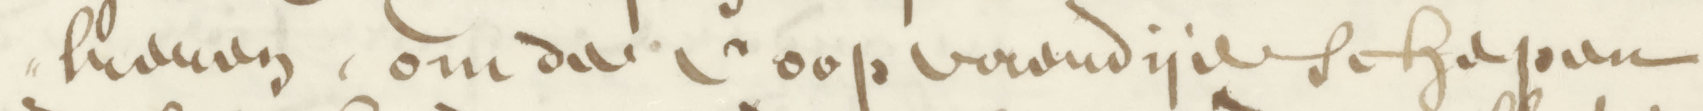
keren, om de Coopvaerdije schepen
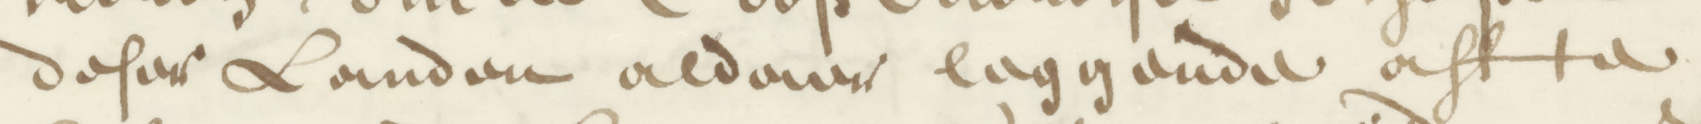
deser Landen aldaer leggende aff te
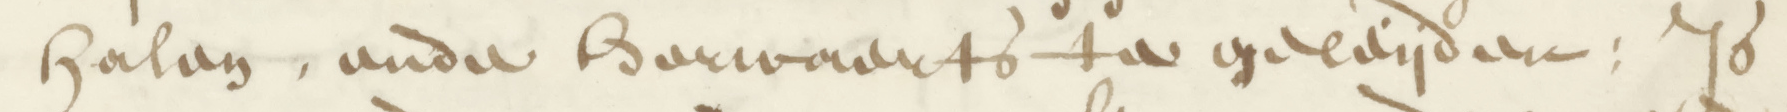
halen, ende herwaerts te geleijden: Is
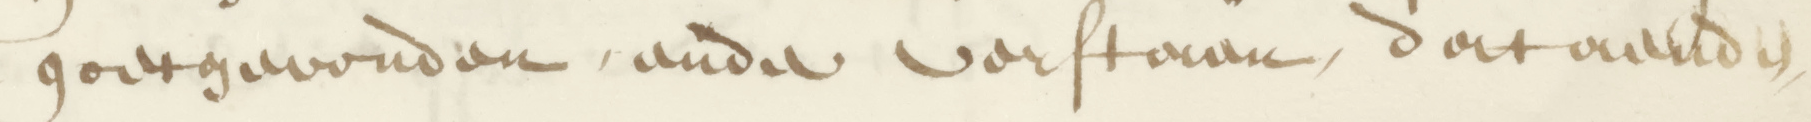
goetgevonden ende verstaen, dat aende
